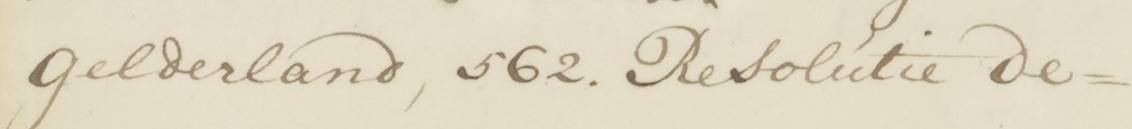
Gelderland, 562. Resolutie de=
